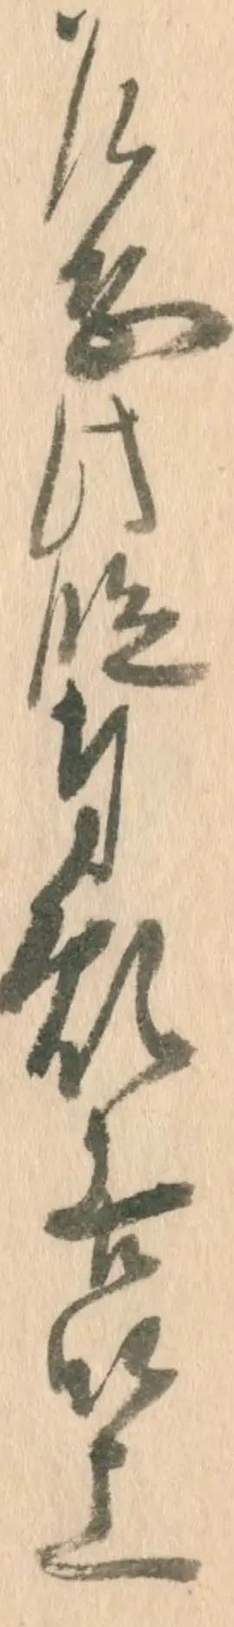乍恐此段奉願上候以上
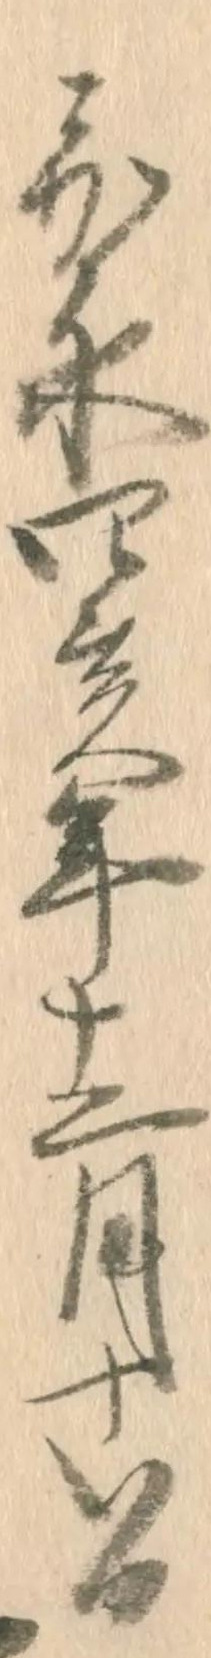嘉永四亥年十二月十八日
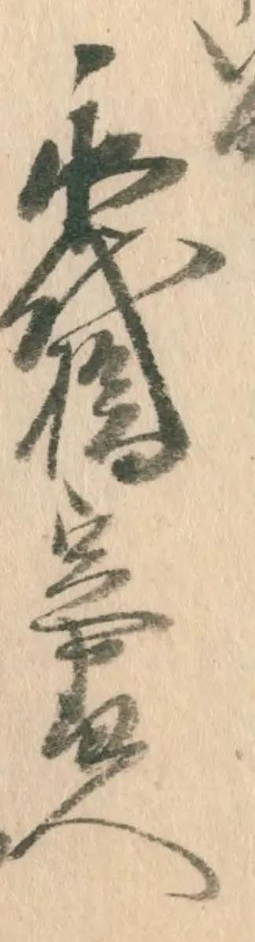永代橋定番人
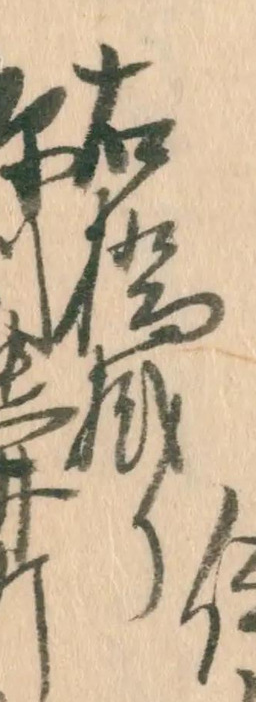右橋掛り
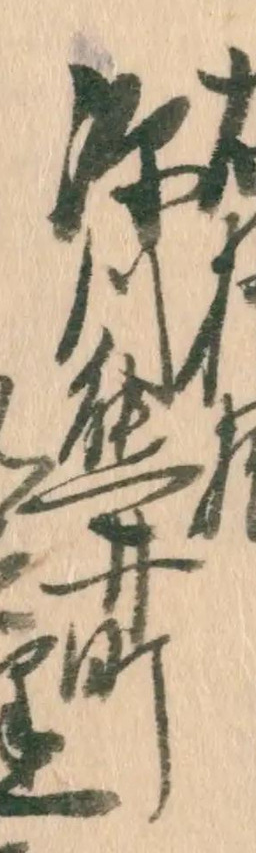深川熊井町

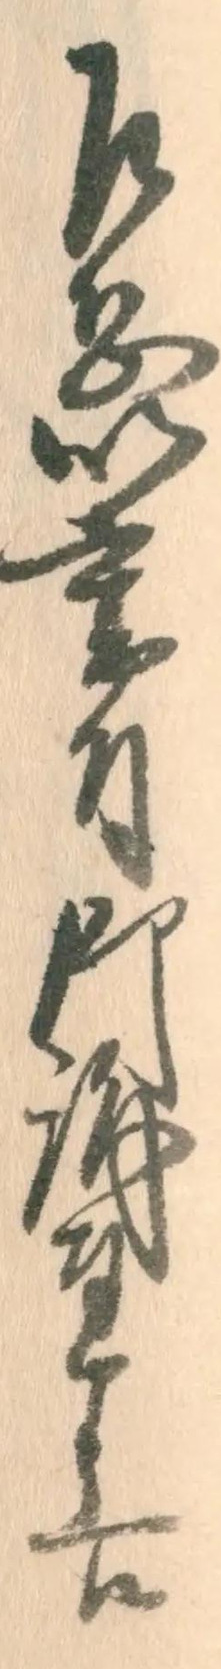乍恐以書付御訴奉申上候
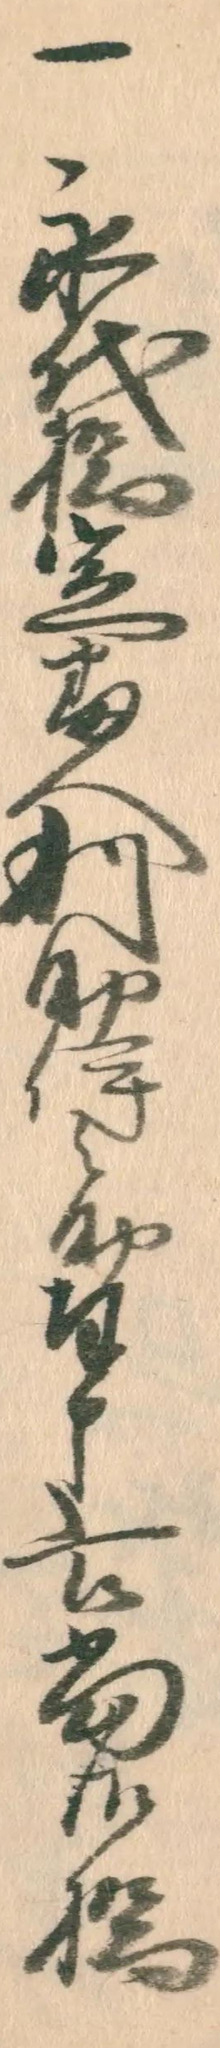一永代橋定番人利助伊之助奉申上候当御橋
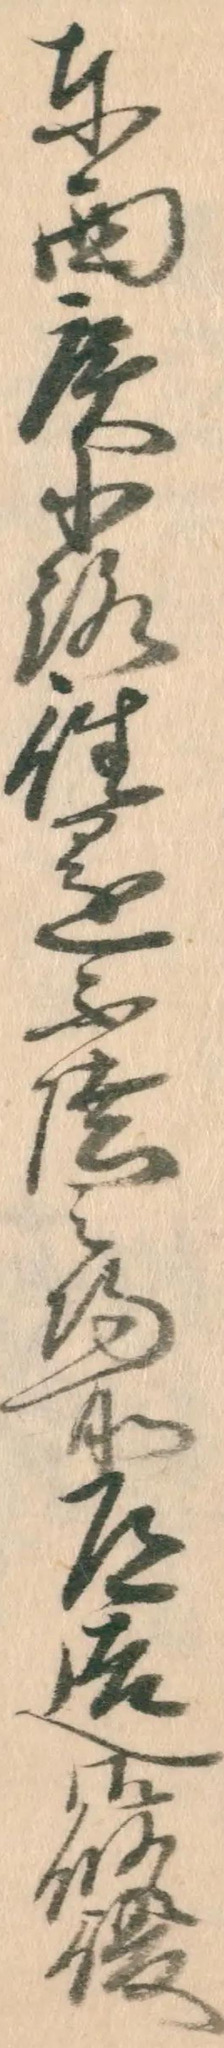東西広小路往還不陸之場所道造御修復
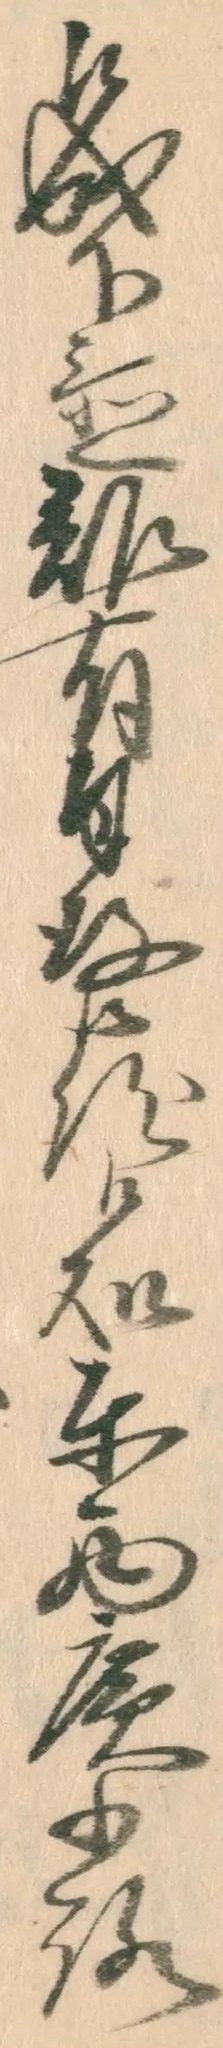被成下置難有奉存候然ル処東西広小路
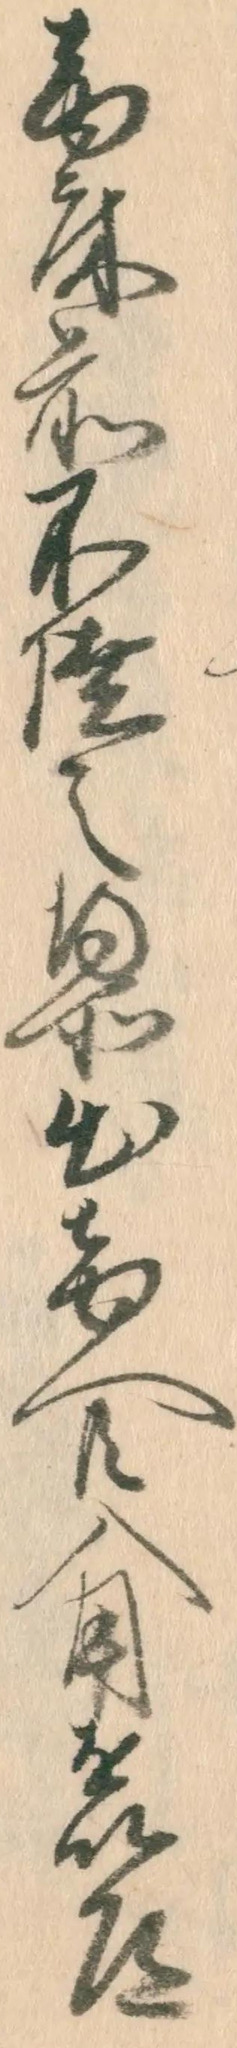商床前不陸之場所出商人共入用を以道
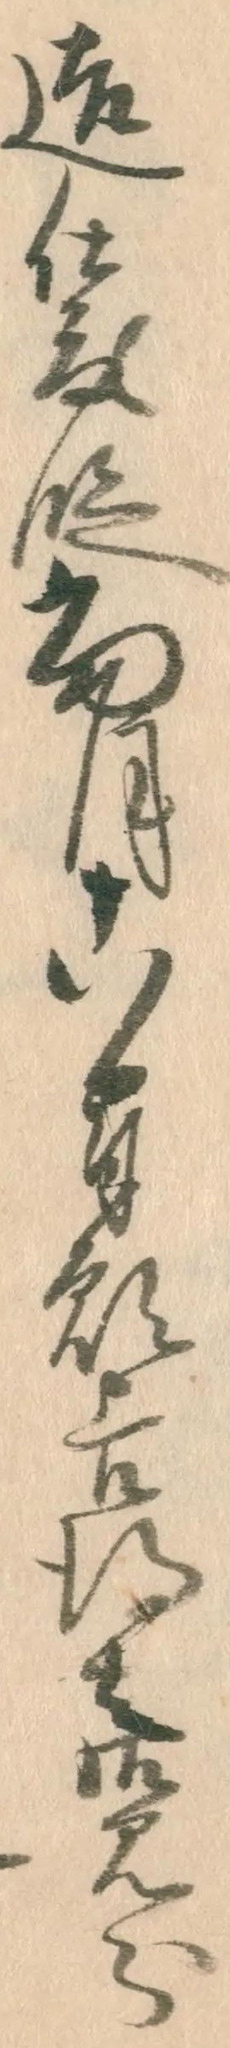造仕度段当月十八日奉願上候得は御見分
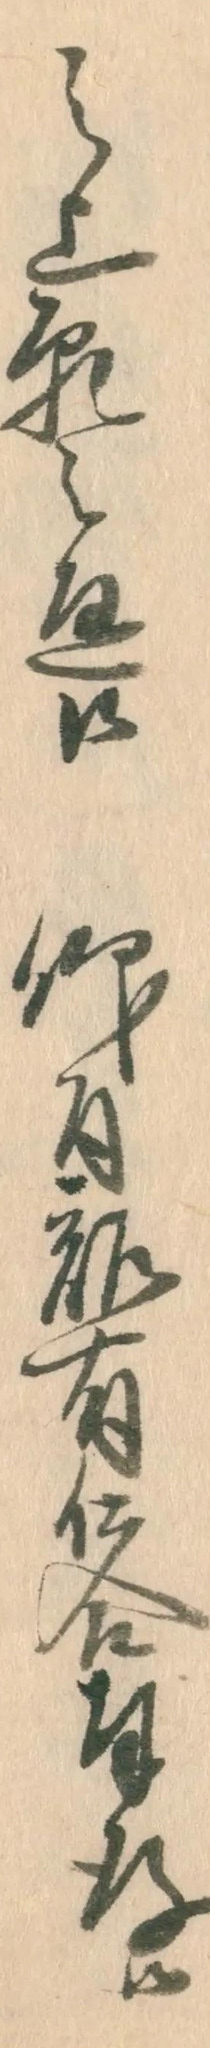之上願之通被仰付難有仕合奉存候

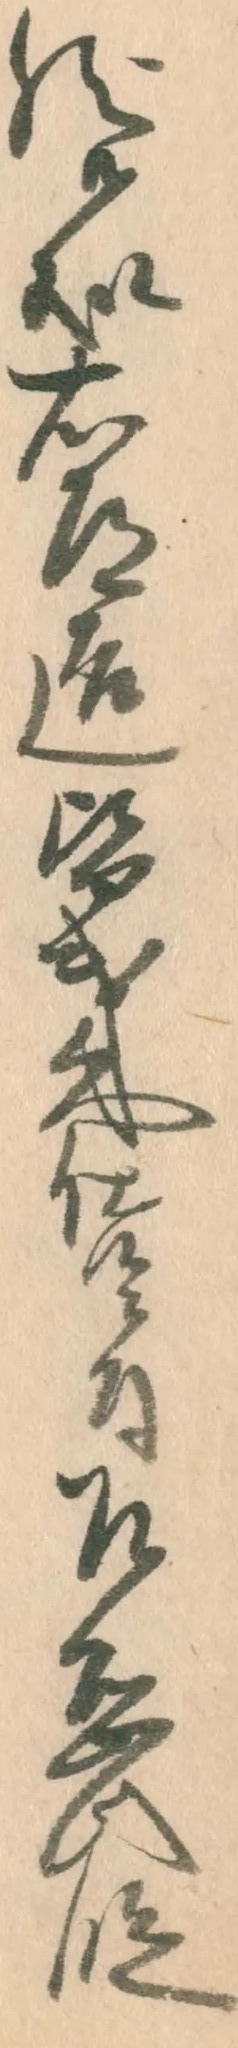然ル処右道造皆出来仕候ニ付乍恐此段
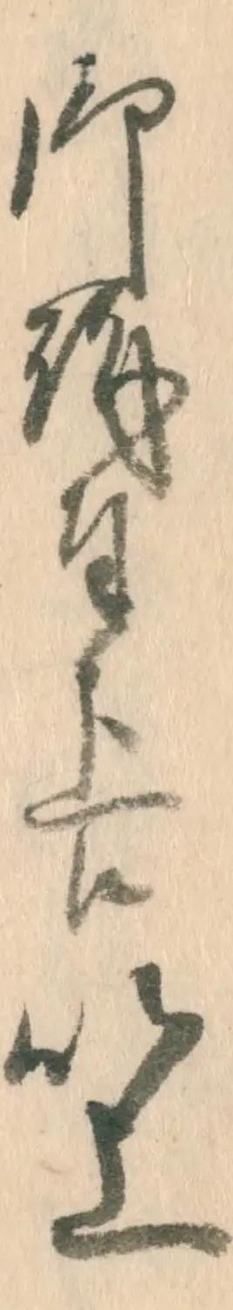御訴奉申上候以上
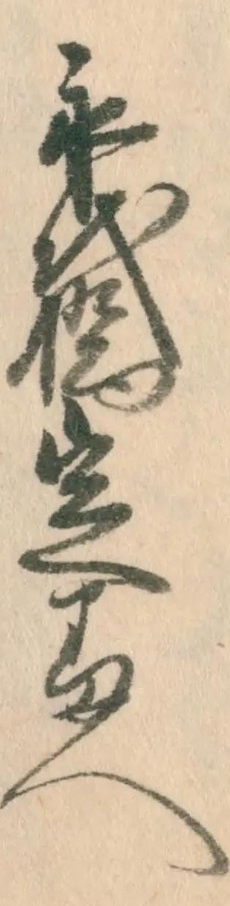永代橋定番人
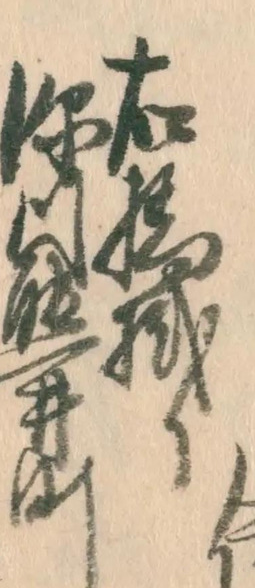右橋掛り
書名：三橋 17巻. [7] 三橋小破御修復書留　但御奉行御掛リ替地震潰橋番屋　嘉永四亥年より安政二卯年迄　上
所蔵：国立国会図書館 National Diet Library, JAPAN
